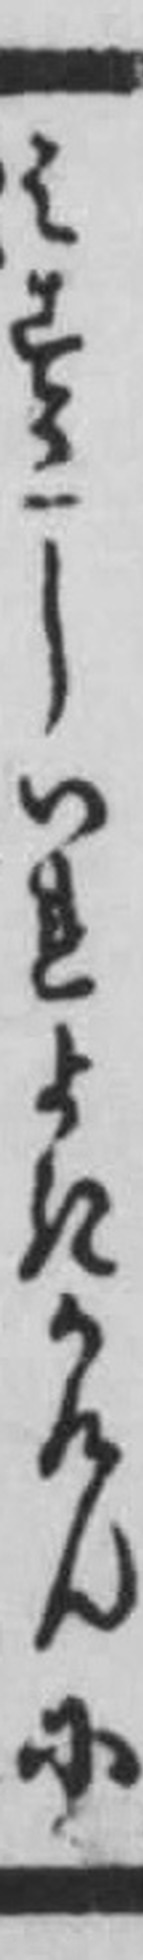みすこしいれよきかけんに
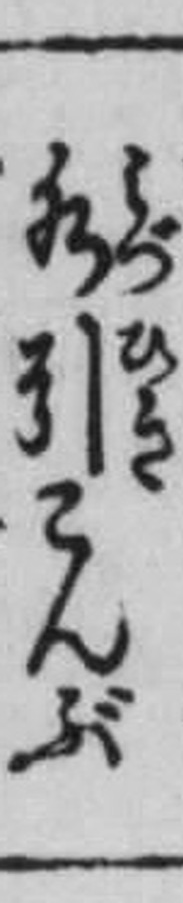水引こんぶ
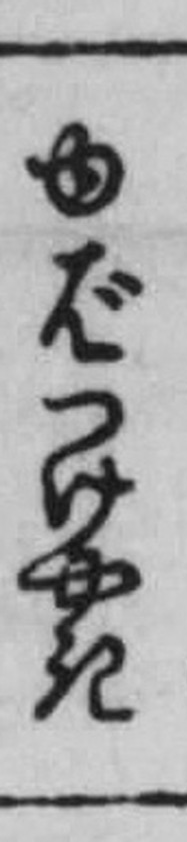ゆばつけやき
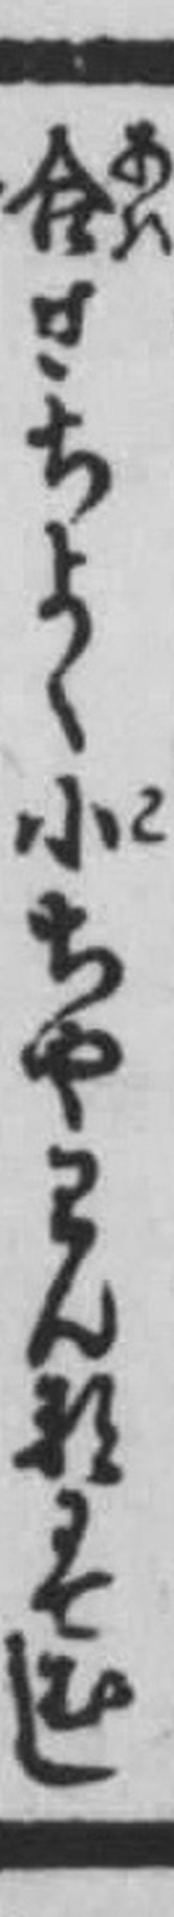合せちよく小ちやわん類にてむし
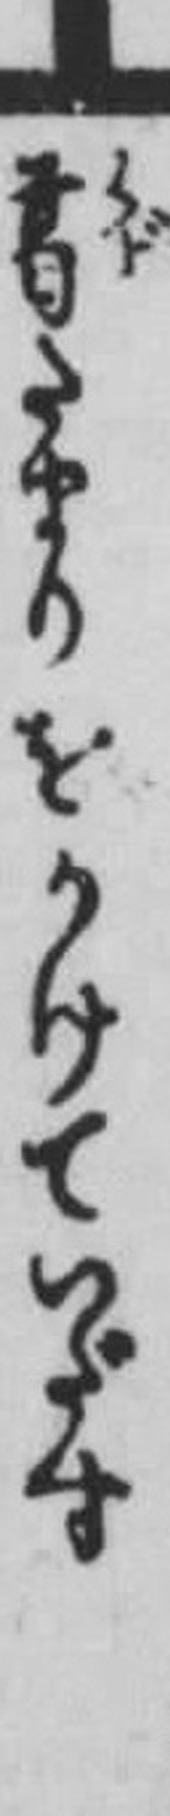葛たまりをかけていだす
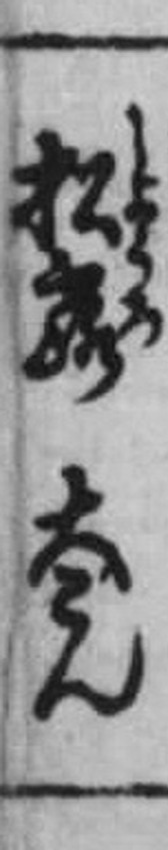松露大こん
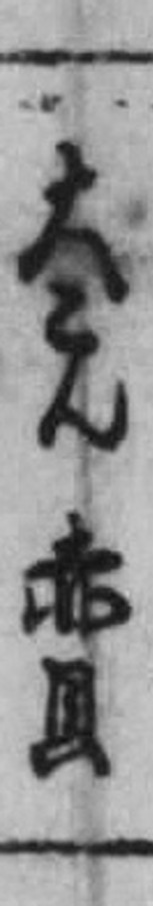大こん赤貝
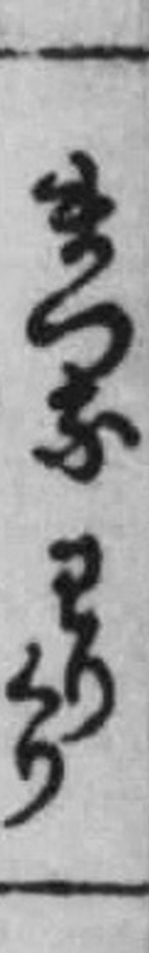まつなわりくり
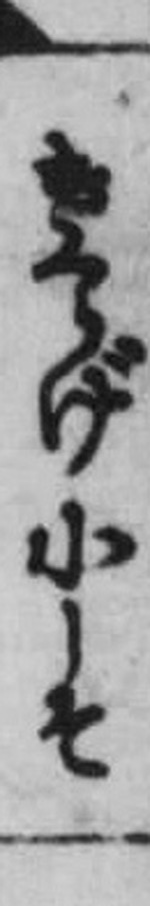きくらげ小しそ
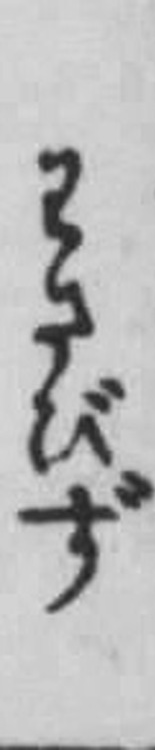わさびず
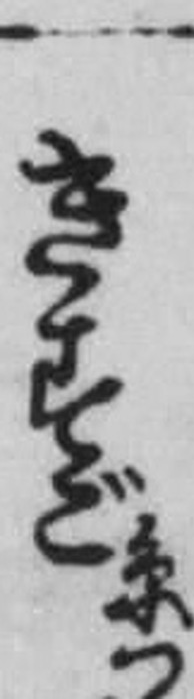きすご
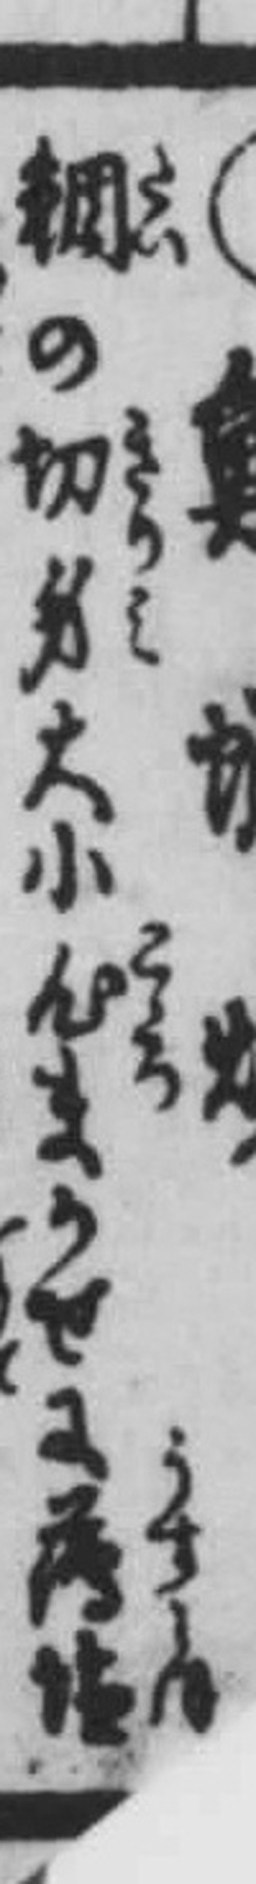鯛の切身大小心まかせに薄塩
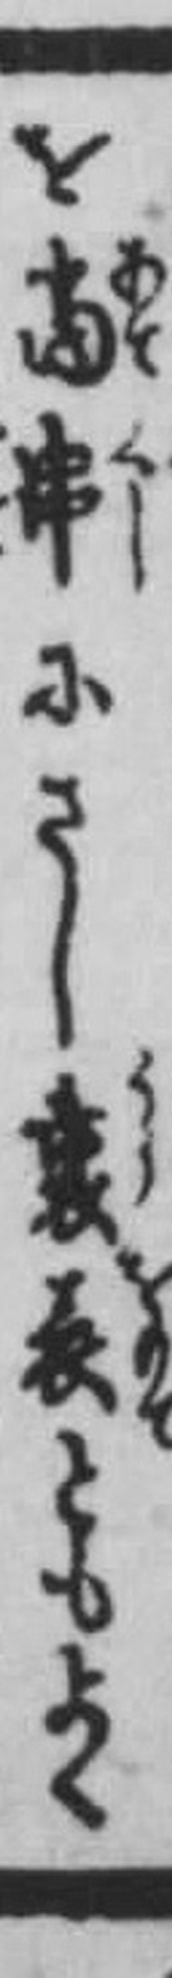を当串にさし裏表ともよく
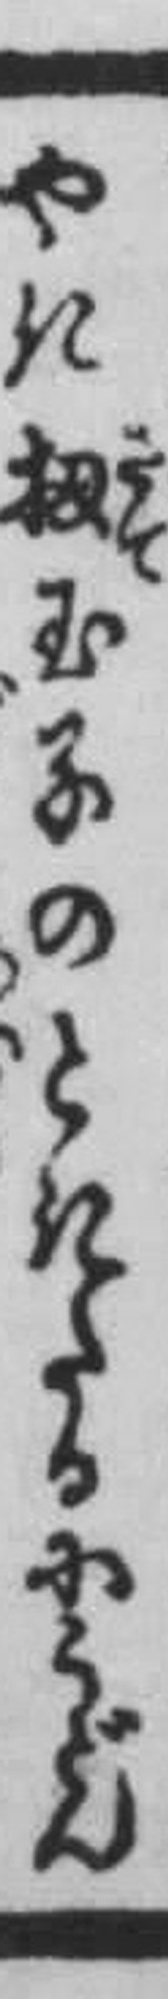やき扨玉子のときたるにうどん
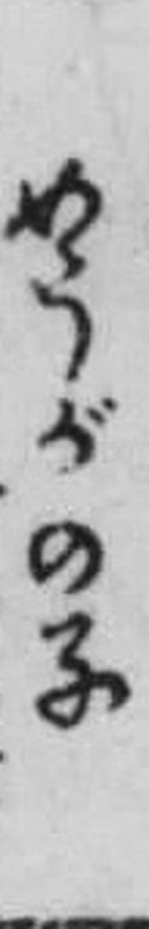めうがの子
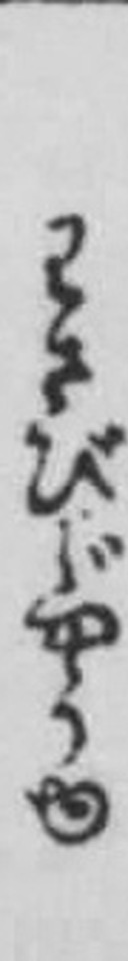わさびじやうゆ
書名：日用重宝魚類精進/料理早工風
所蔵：大阪府立大学学術情報センター 国文学研究資料館
